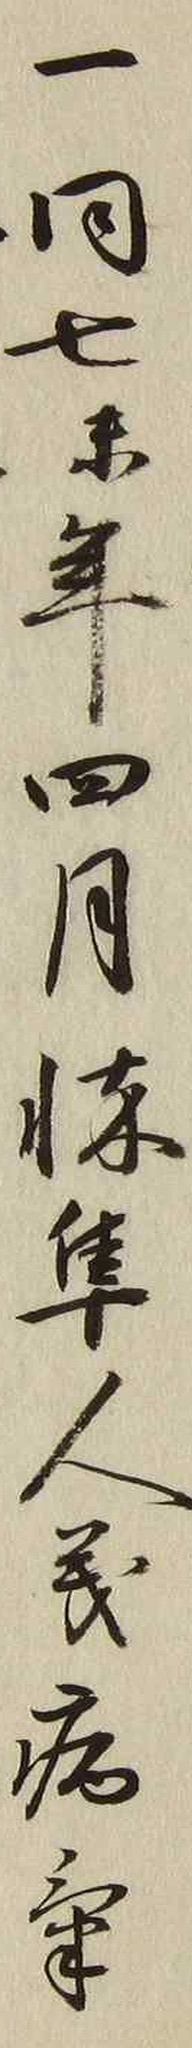一同七未年四月倅隼人義病気
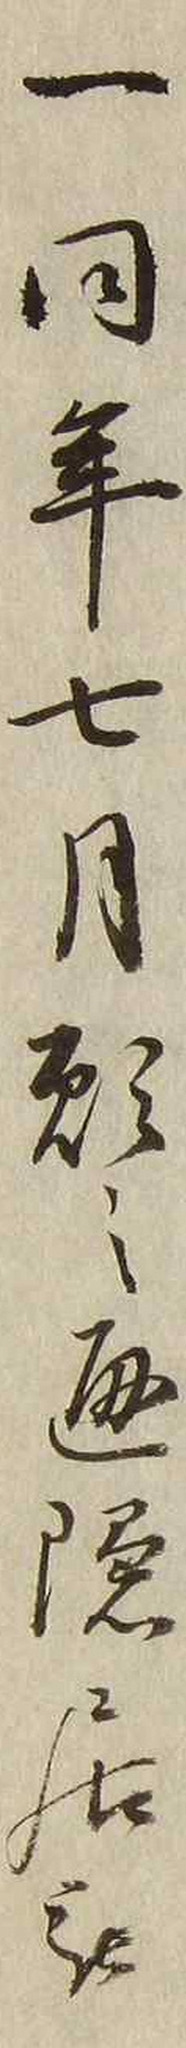一同年七月願之通り隠居

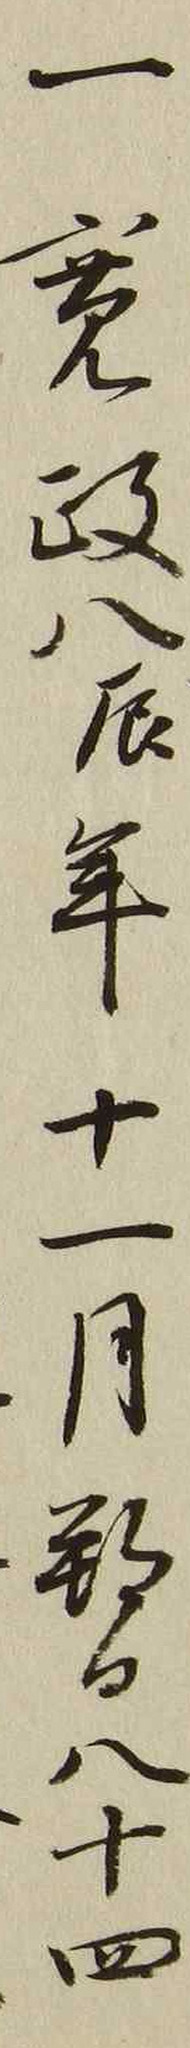一寛政八辰年十一月朔日八十四
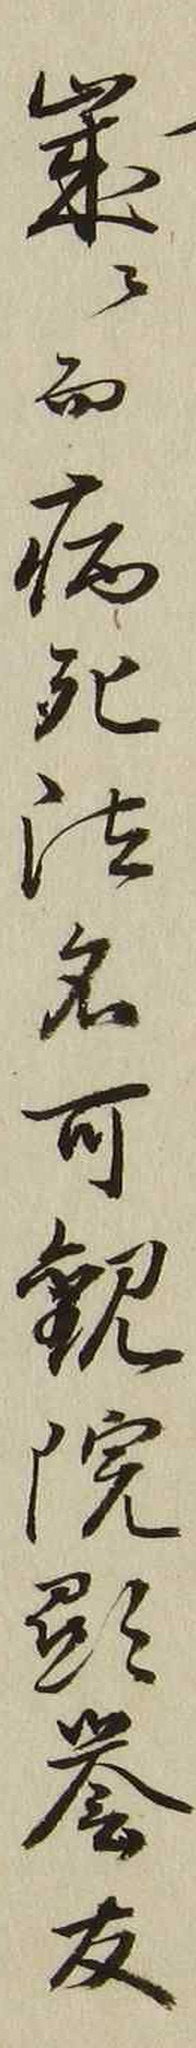歳ニて病死法名可観院顕誉友
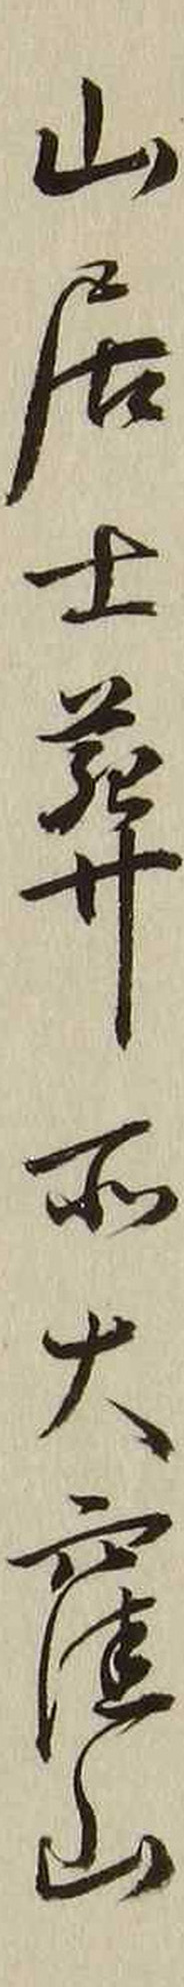山居士葬所大窪山
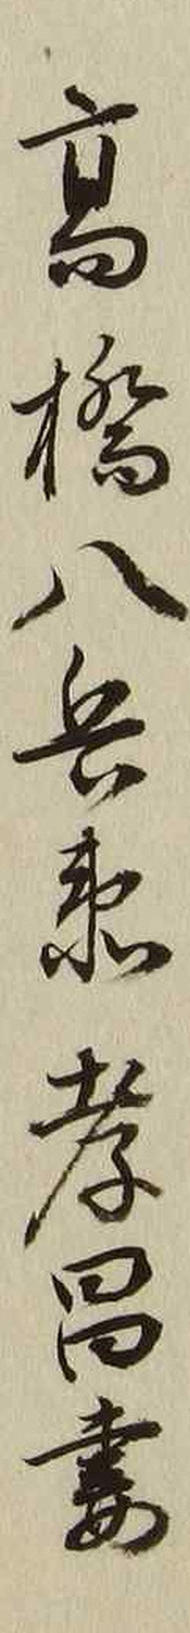女高橋八兵衛孝昌妻
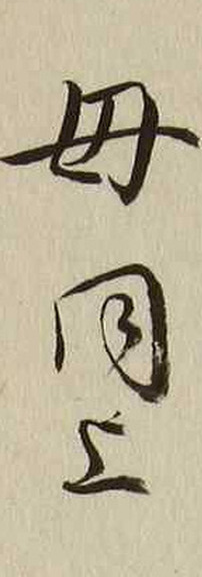母同上
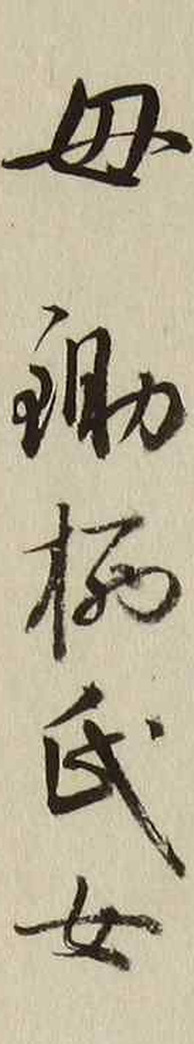母鋤栖氏女
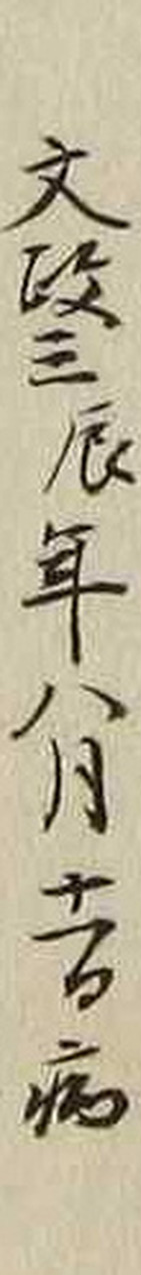文政三辰年八月十一日病
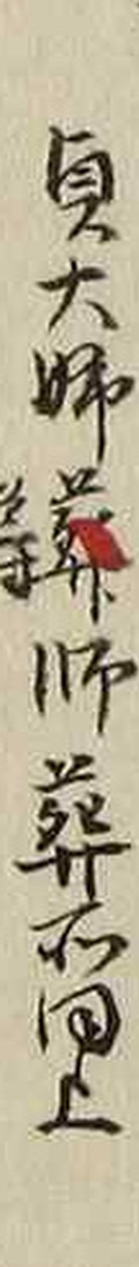貞大姉導師葬所同上
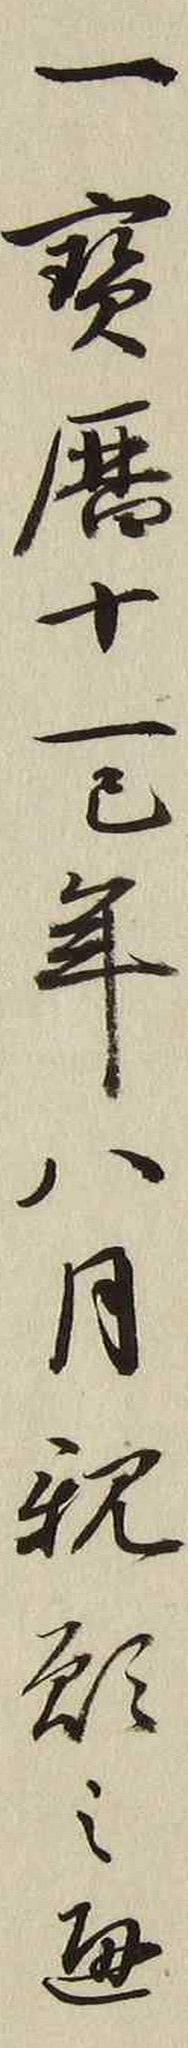一宝暦十一巳年八月親願之通
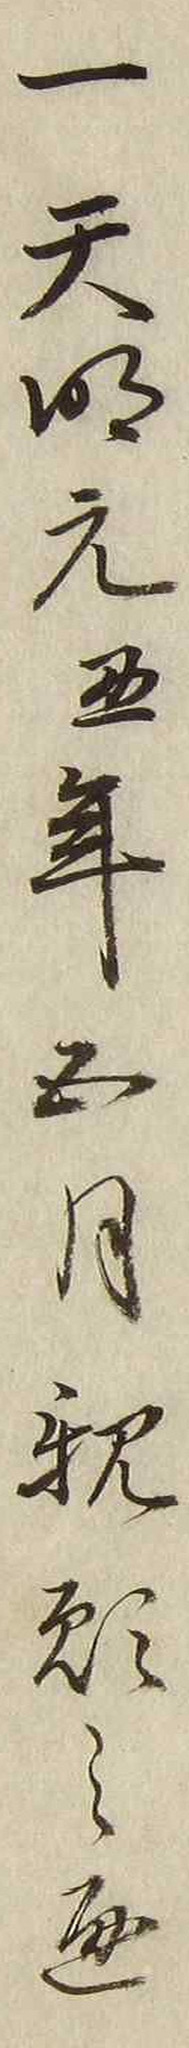一天明元丑年五月親願之通

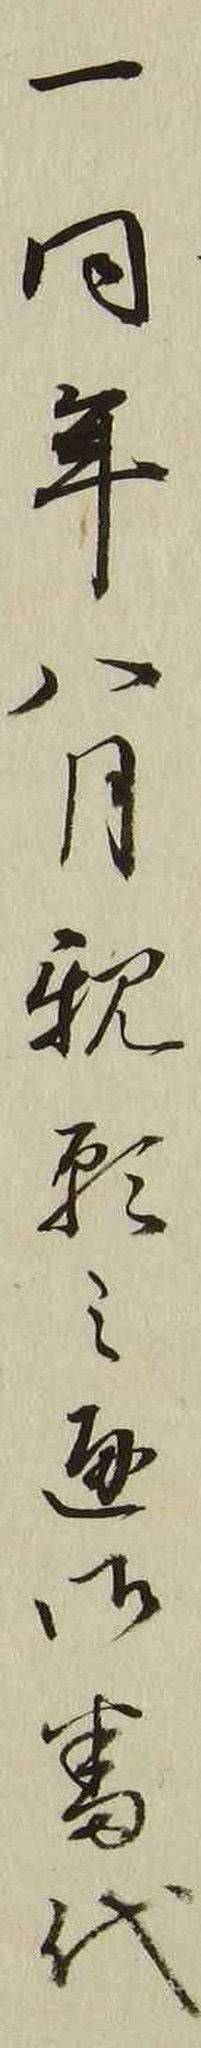一同年八月親願い之通五御番代
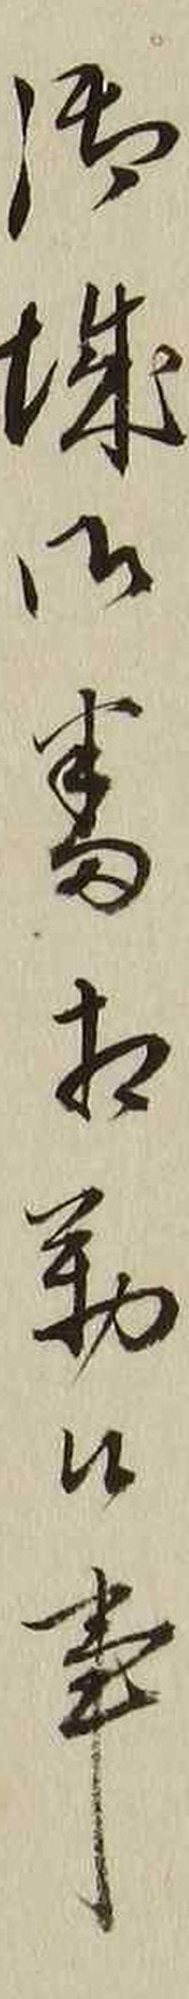御城御番相勤め候事
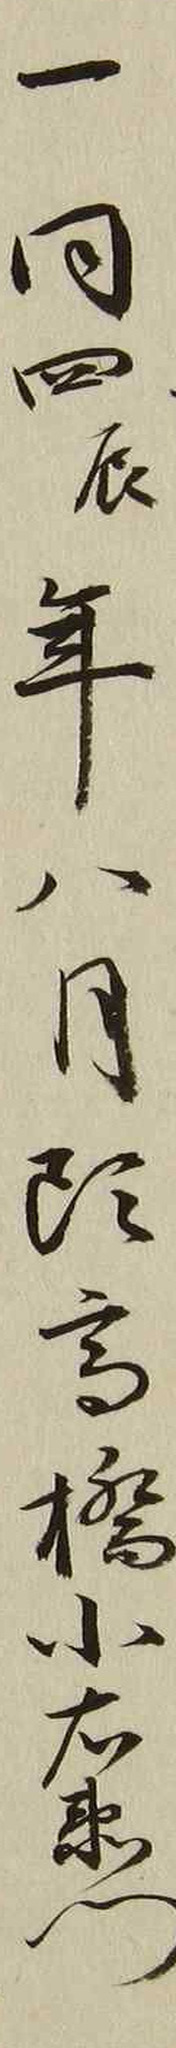一同四辰年八月頭高橋小右衛門
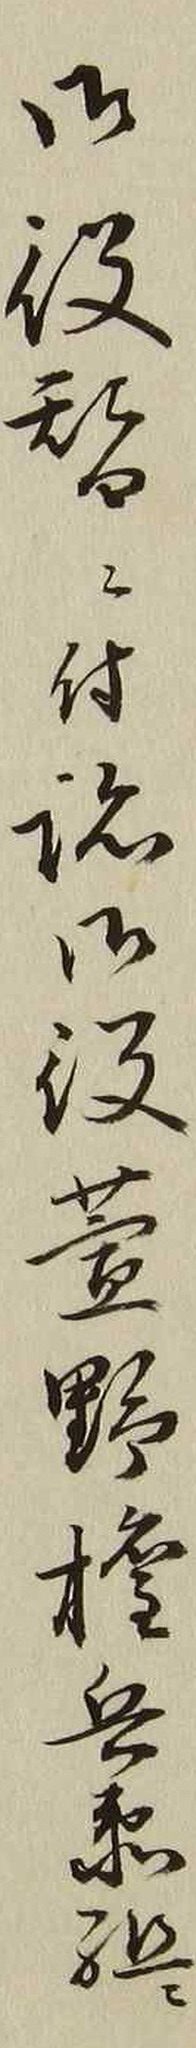御役替えニ付諸御役萱野権兵衛組ニ
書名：諸士系譜　巻之19　い之部19
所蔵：会津若松市立会津図書館
